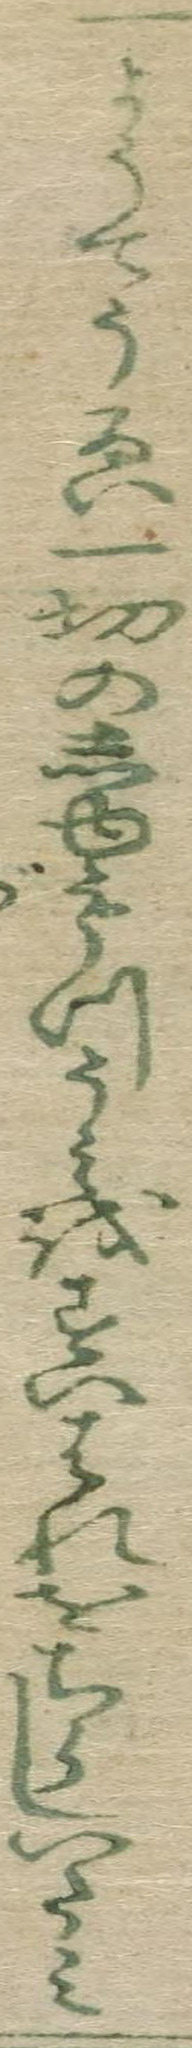一ようてうる一切のしゆもつうみをすいはれをちらしいたみ
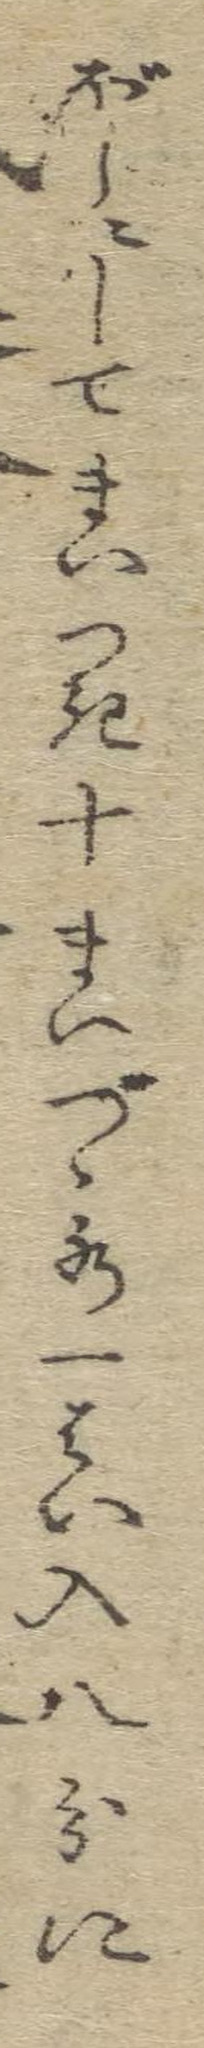ぼしにしてまいつき十まいづゝ水一はい入八分に
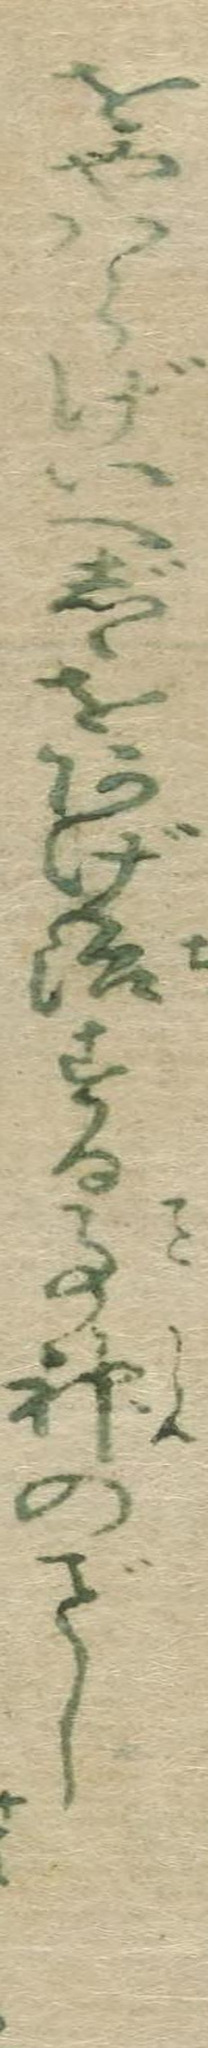をやはらげいへじをあげ治する事神のごとし
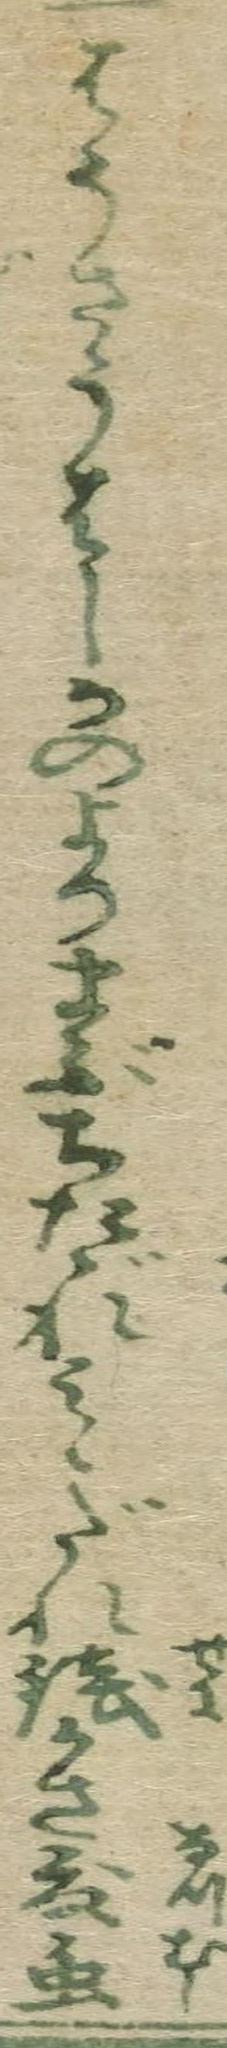一はうさうはしかのよりまぶちたゞれみゝだれ銭かさ夏虫
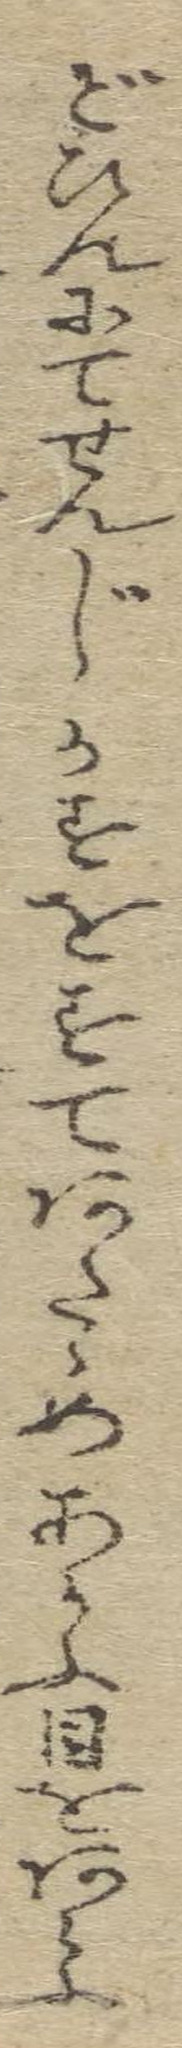どびんにてせんじかすをすてあたゝめあらふ目をあらふ
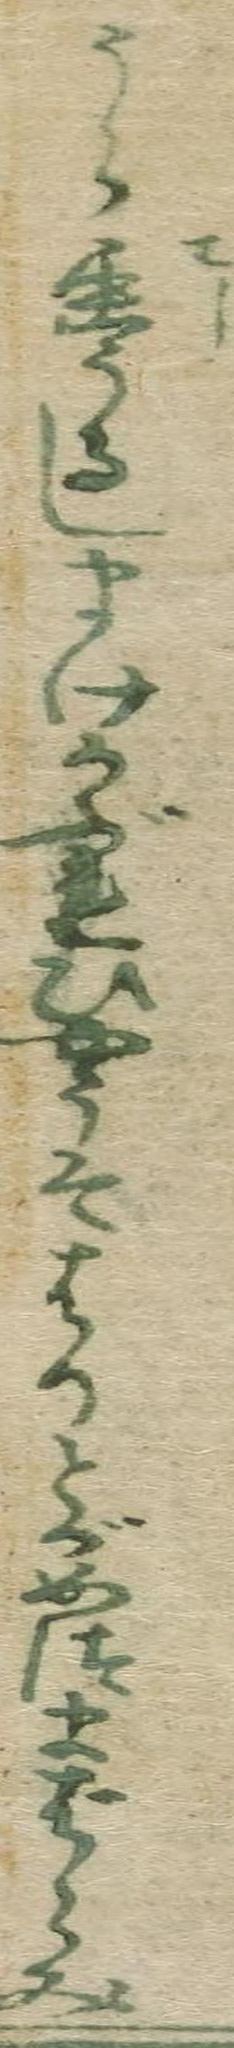うら虫うるしまけかぶれひやうそはりとがめつまばらみ
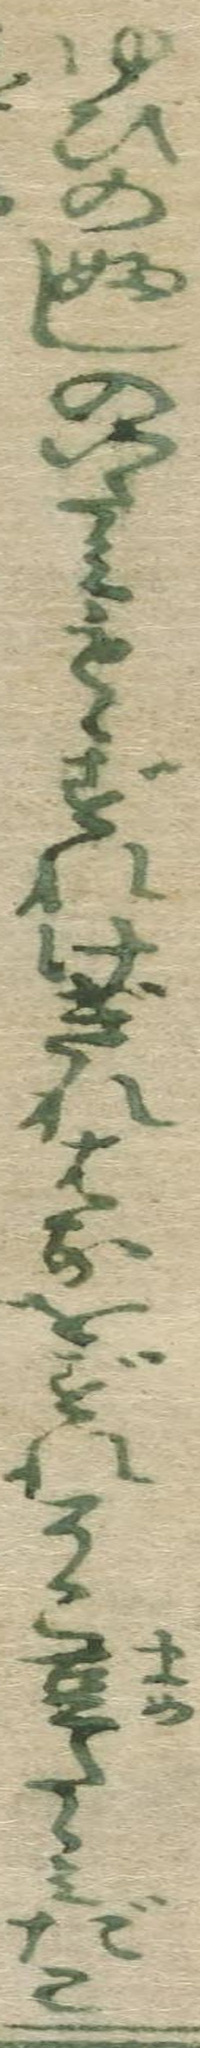ゆびのふしのいたみもゝずれけぎれはなをずれそこ豆たゝみだこ
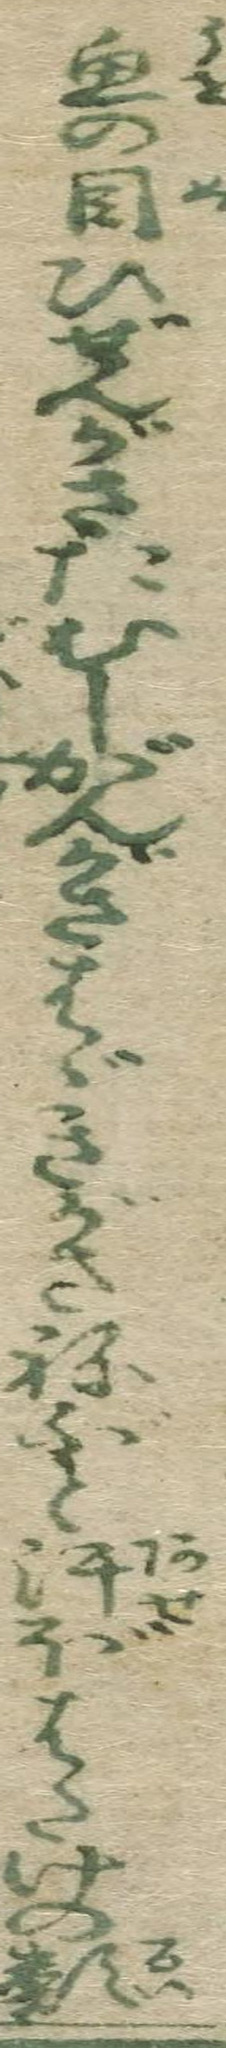魚の目ひぜんがさたむしがんがさはゞきがさねふと汗ぼはたけの類
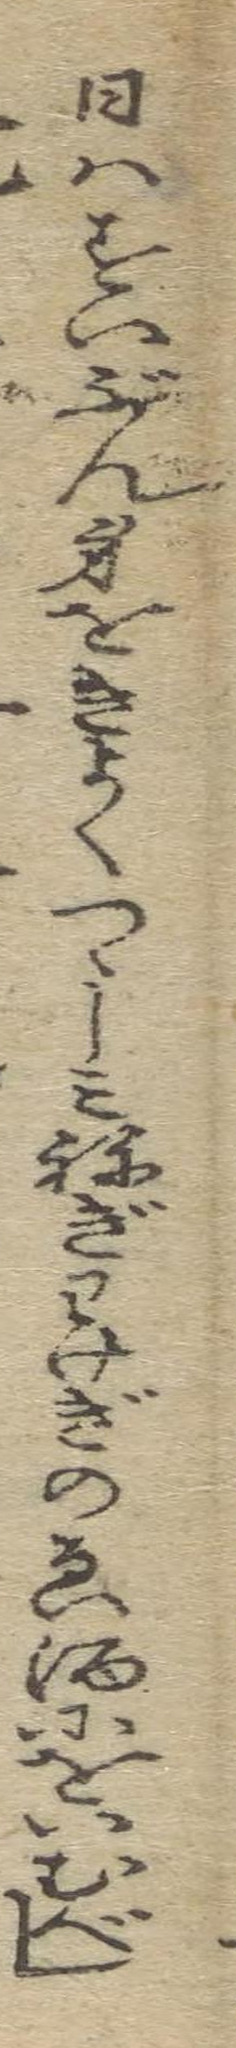日はすいぶん身をきよくつゝしみねぎわけぎのるい酒にをいむべし
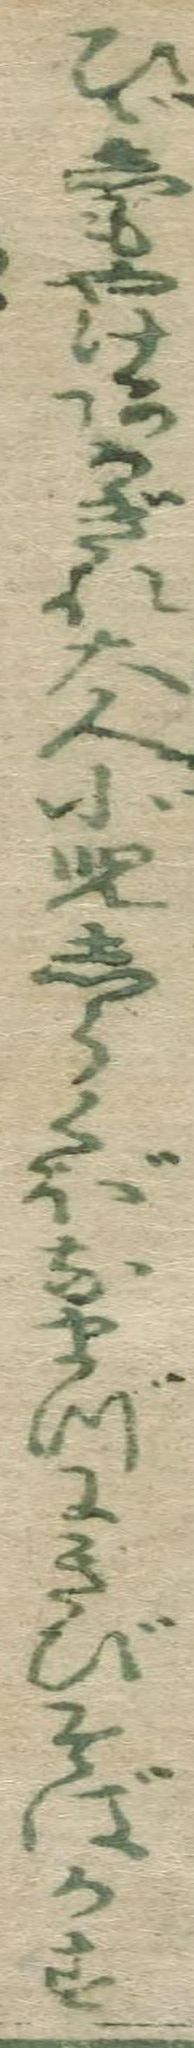ひゞしもやけあかぎれ大人小児しらくぼなまづにきびそばかす
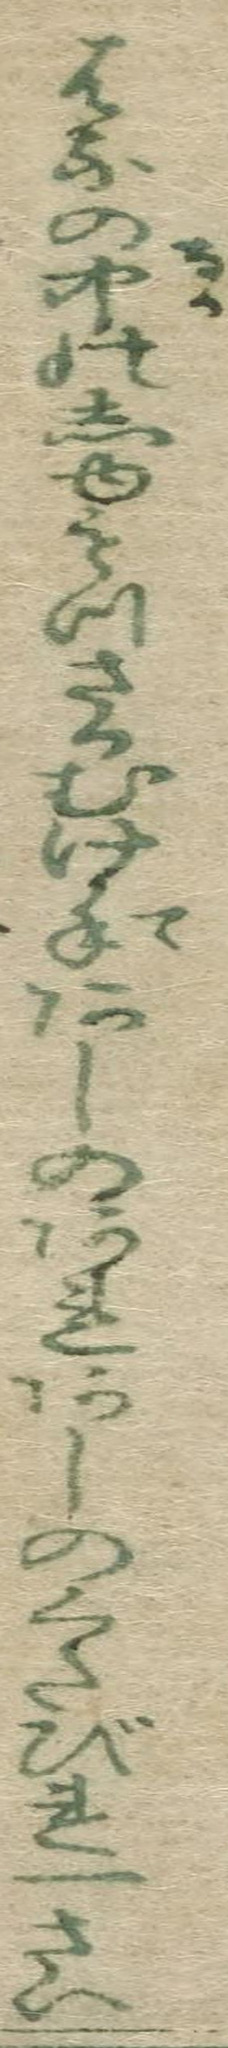はなの中のしゆもつさかむけ手あしのあれあしのくたびれ一さい
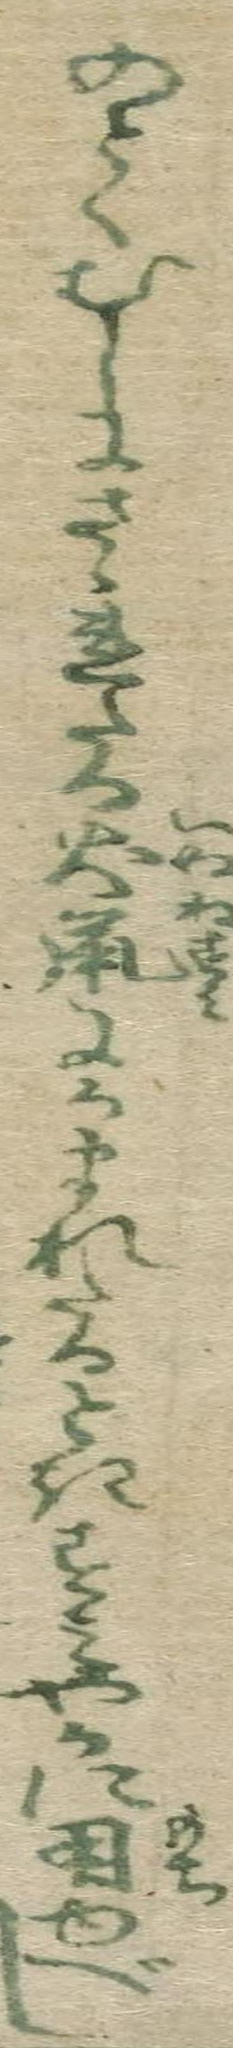のとくむしにさゝれたる犬鼠にかまれたるときすみやかに用ゆべし
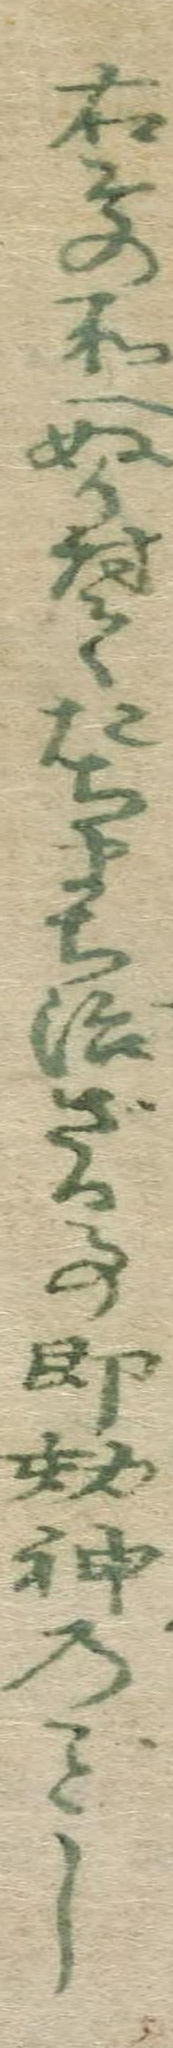右その所へぬり付てたちまち治ざる事即効神のごとし
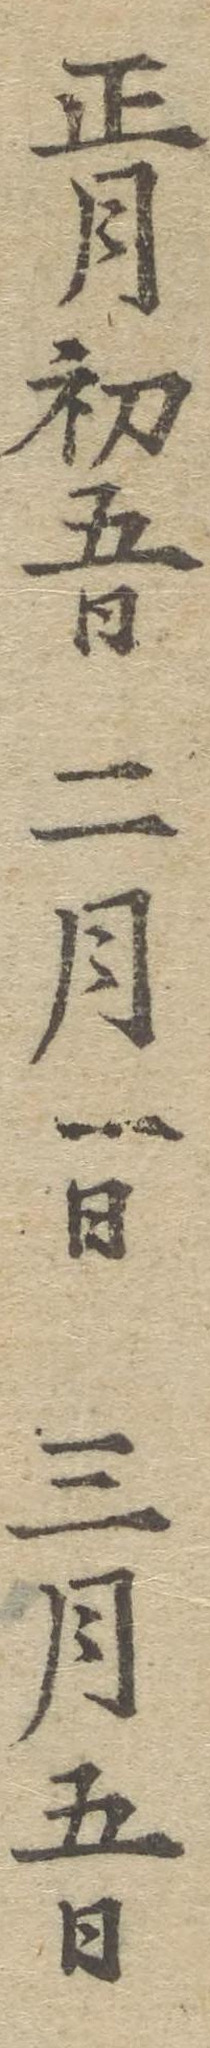正月初五日二月一日三月五日
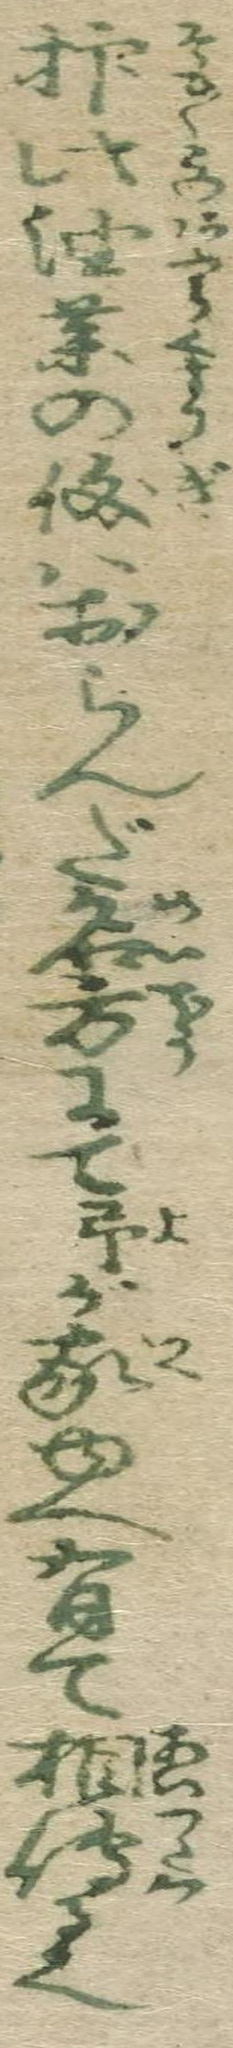抑此油薬の儀はおらんだ名方にて予が家ゆへ有て相伝る也
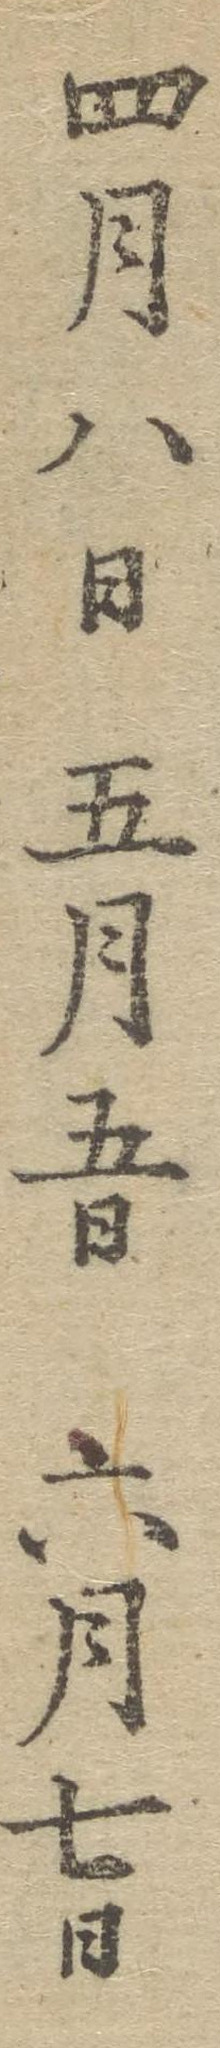四月八日五月五日六月七日
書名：浪華薬種問屋能書張交帖. 二
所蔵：国立国会図書館 National Diet Library, JAPAN
